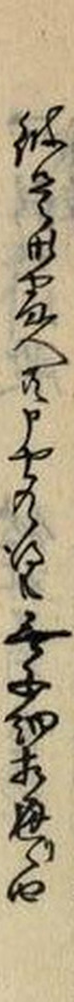彼是御番人共申聞候得共無子細相通り候由
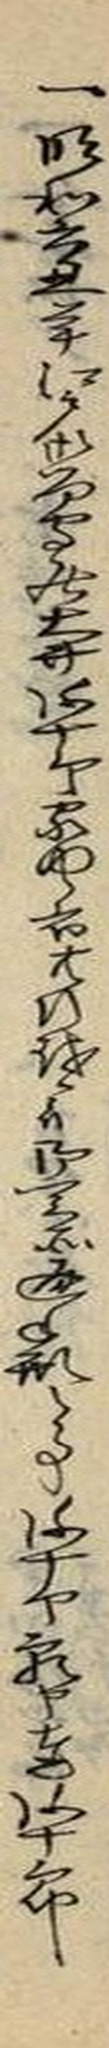一明和六丑年江戸御留守居大井弥十郎家内之者共引越候ニ付御関所通手形之事弥十郎願申達弥十郎
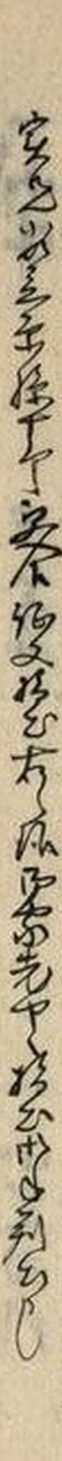実兄小笠原孫十郎受合証文指出右之趣御家老中へ指出御手判出申候
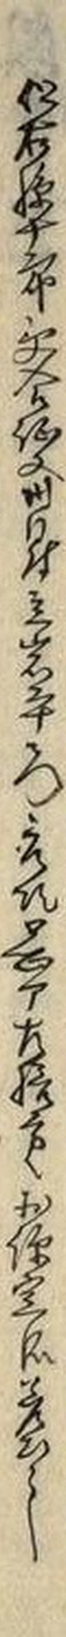但右孫十郎受合証文御目付立岩平右衛門取次岡部左膳方へ於評定所差出之
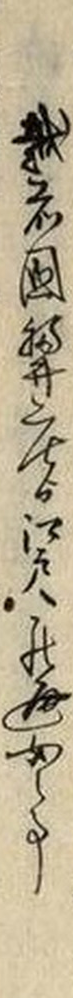越前国福井庄ゟ江戸へ罷通女之事
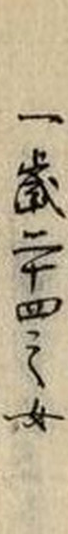一歳二十四之女
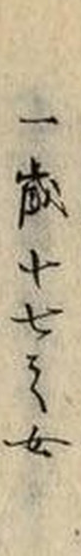一歳二十四之女
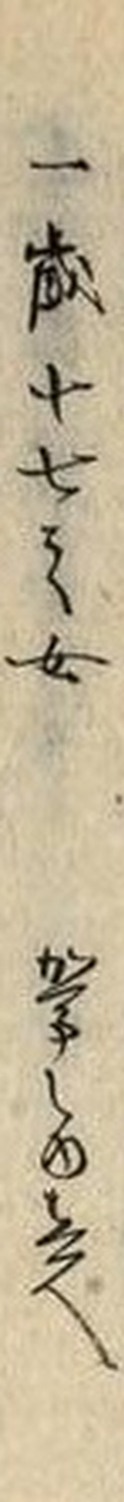一歳十七之女駕之内壱人
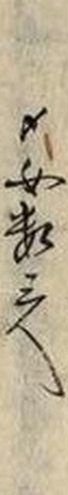〆女数三人
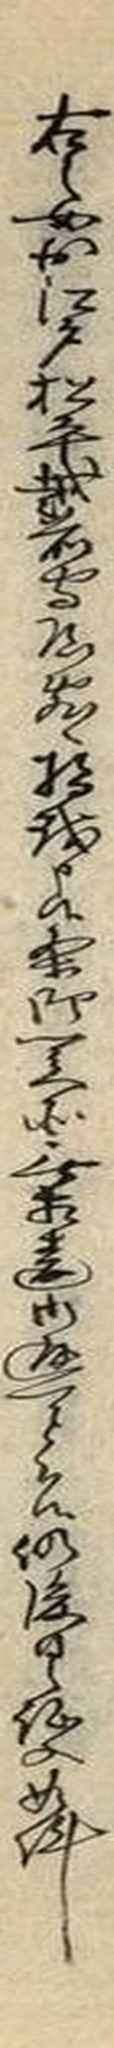右之女於江戸松平越前守屋敷へ指越申候条御関所無相違御通可被下候仍後日之証文如件
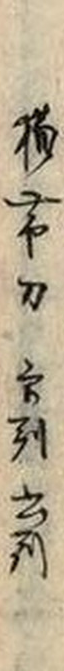狛帯刀印判書判
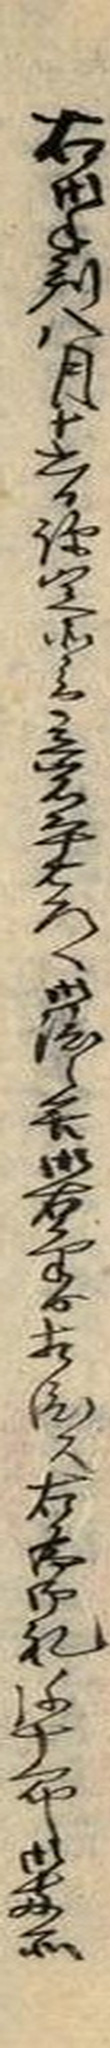右御手判八月十六日評定所ニ而立岩平右衛門へ御渡之筈御右筆ゟ相渡ス右為御礼弥十郎御両所

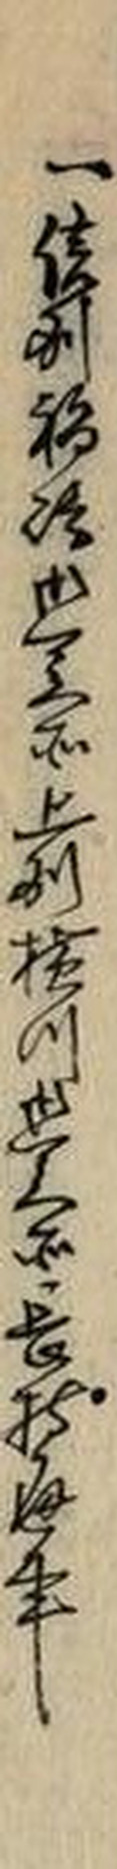一信州福嶋御関所上州横川御関所長持通事
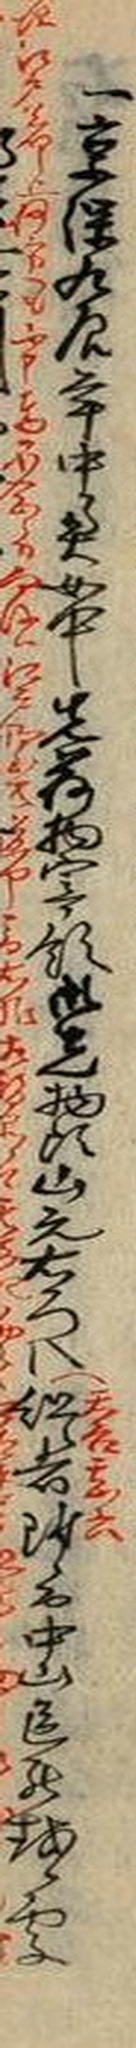一享保九辰年中奥女中先荷物宰領御先物頭山元右衛門八組之者天谷甚六附候而中山道罷越候処
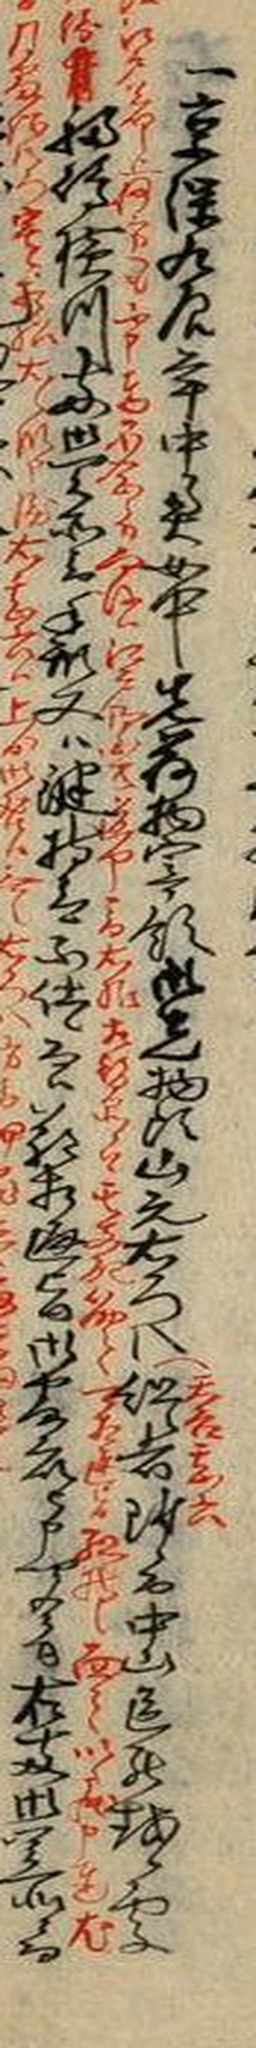福嶋横川両御関所ニ而手形又ハ鍵持参不仕候而ハ難相通旨御番衆被申聞候ニ付右両御関所ニ而
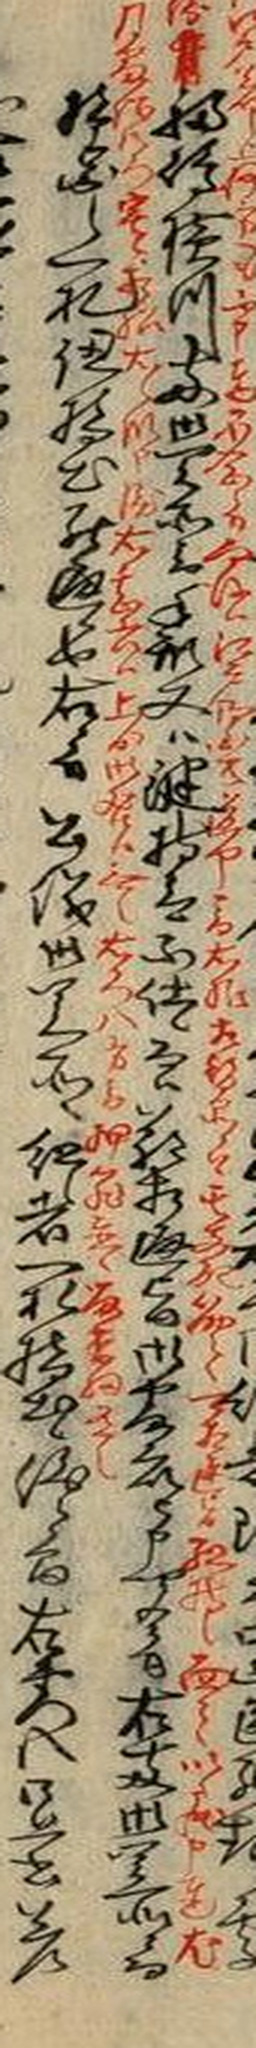指図之一札認指出罷通候由右ニ付公儀御関所へ組之者一札指出候儀ニ候間右衛門八口上書差
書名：御国他国諸事之部
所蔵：福井県文書館 Fukui Prefectural Archives
